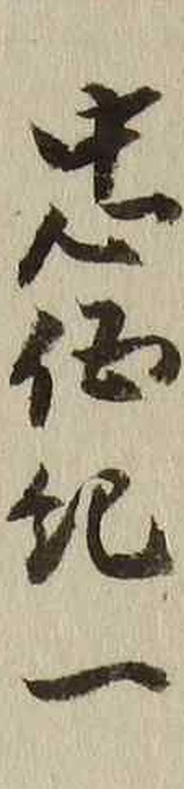忠伍紀一
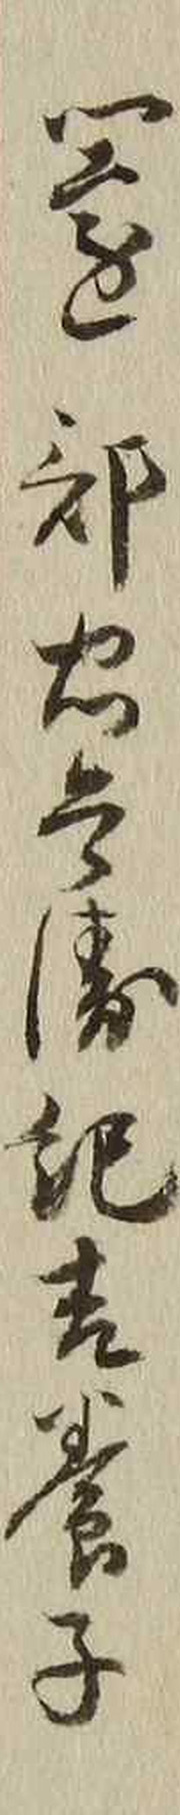園部忠兵衛紀吉養子
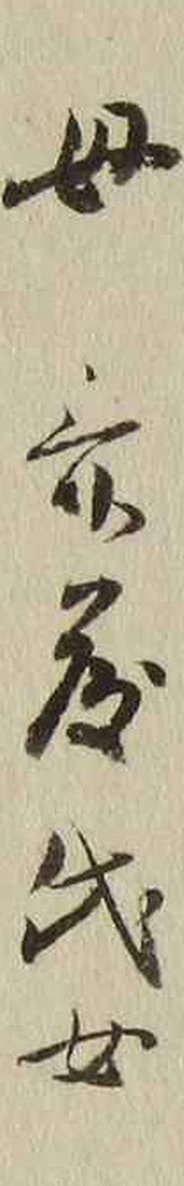母斎藤氏女

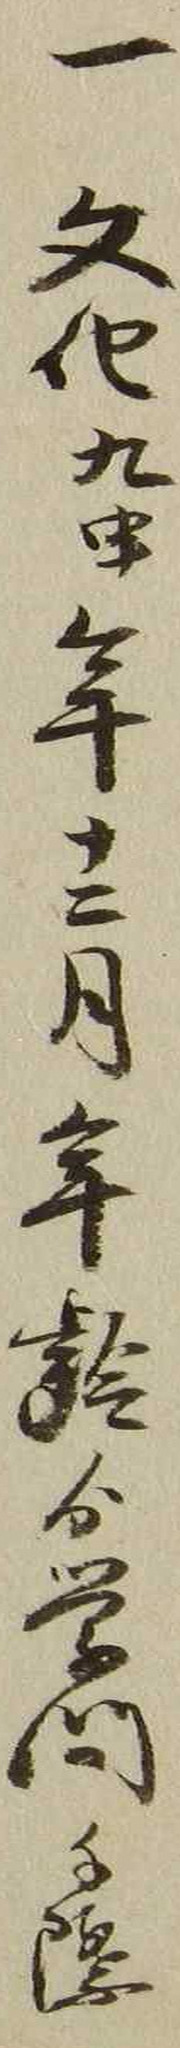一文化九申年十二月年齢ゟ学問手際
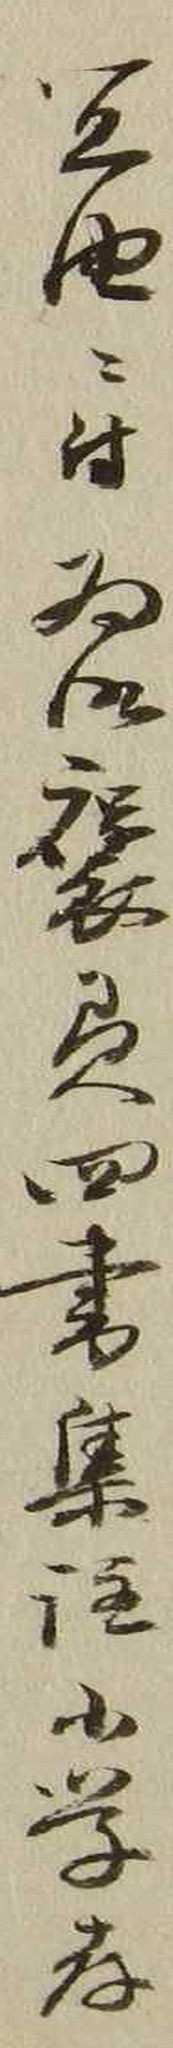宜由ニ付為御褒美四書集註小学孝
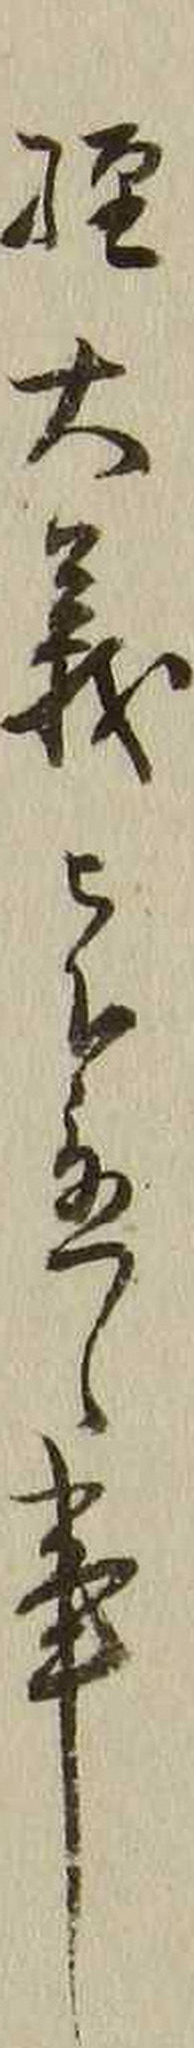経大義被下置候事
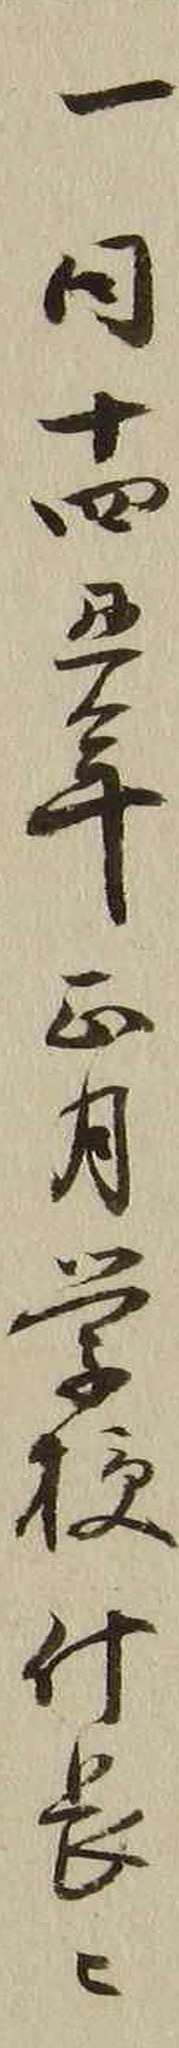一同十四丑年正月学校什長被
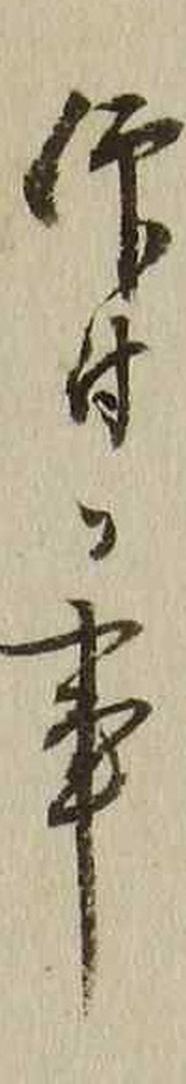仰付候事
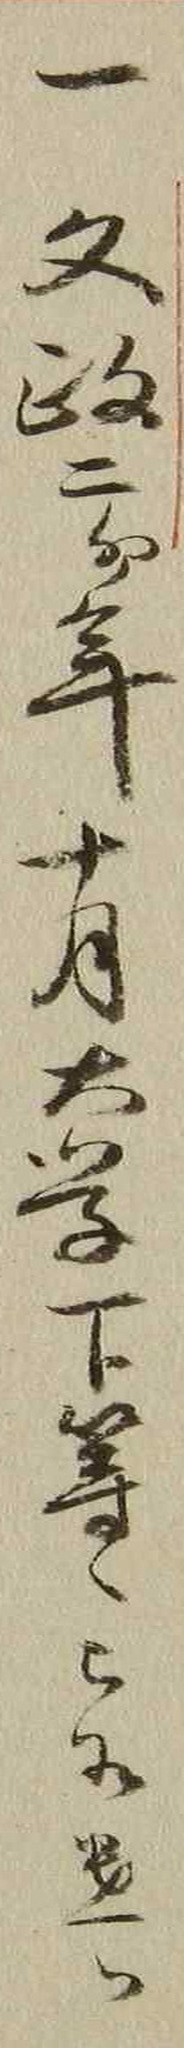一文政二卯年十月大学下等へ被相遣候
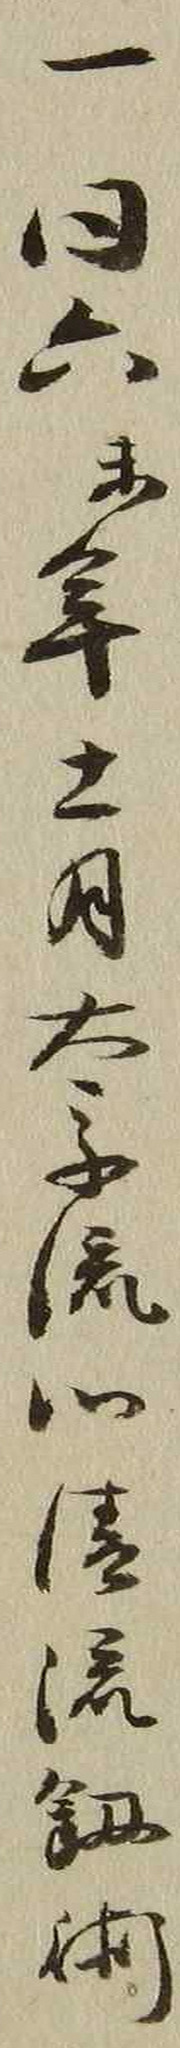一同六未年十一月太子流心清流剣術
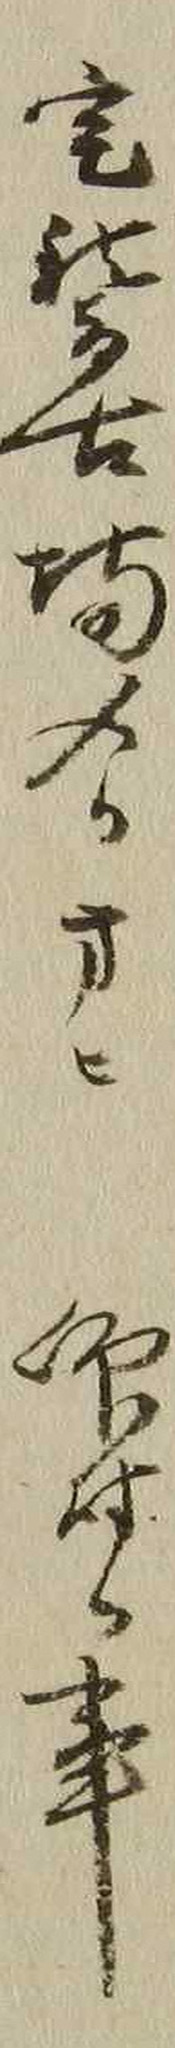定稽古場〆り方被仰付候事
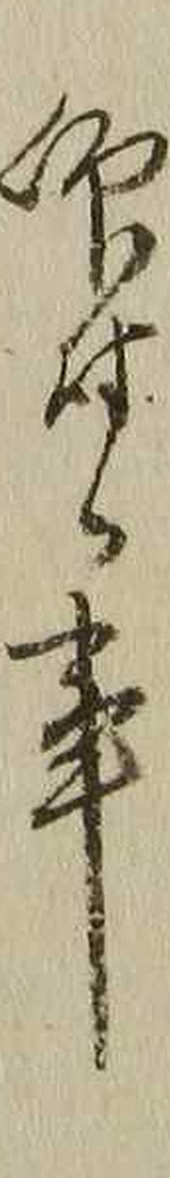仰付候事
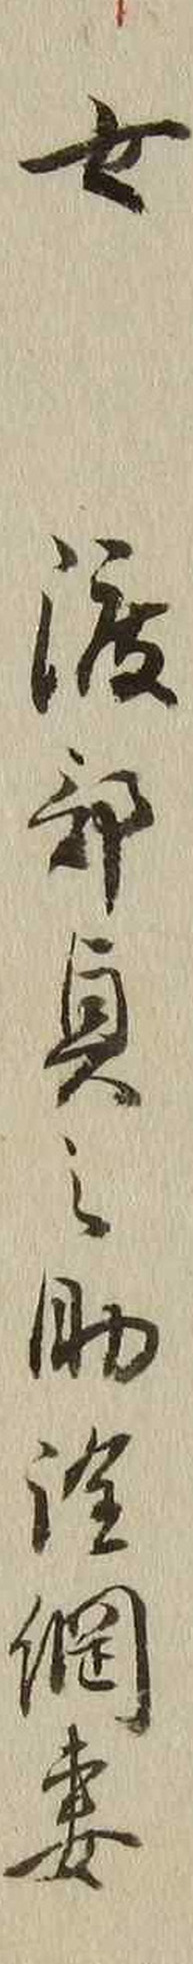女渡部貞之助詮綱妻
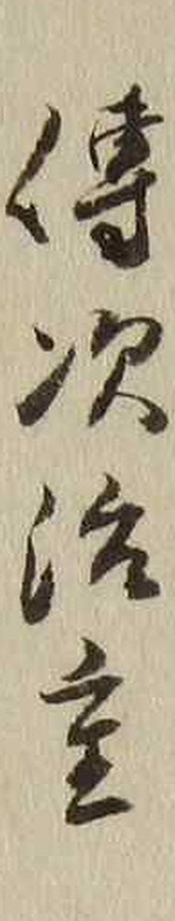伝次治重
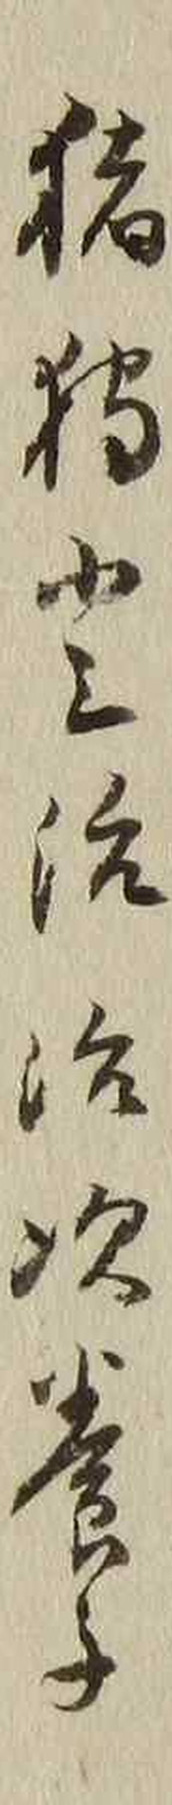猪狩登治治次養子
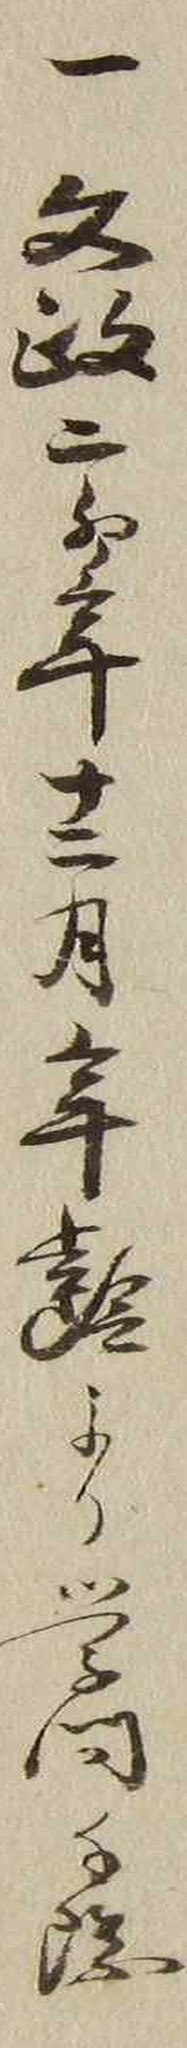一文政二卯年十二月年齢より学問手際
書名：諸士系譜　巻之236　ふ之部4
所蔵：会津若松市立会津図書館
